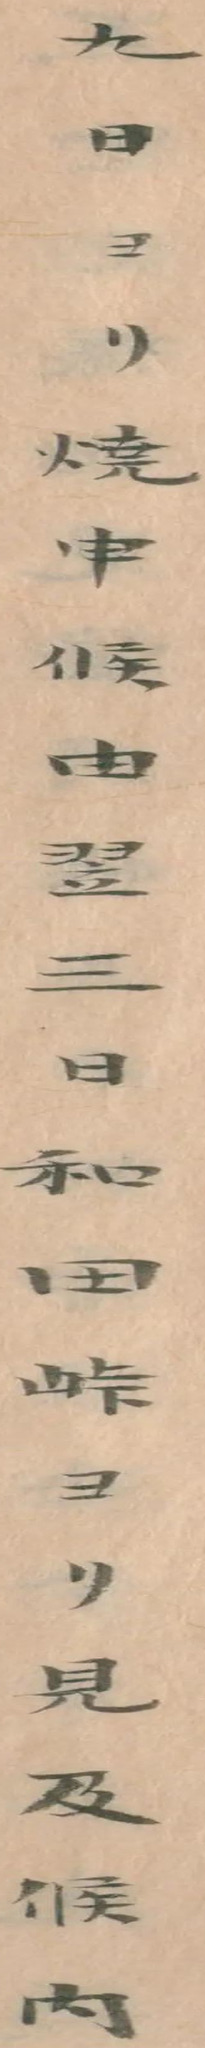九日ヨリ焼申候由翌三日和田峠ヨリ見及候内

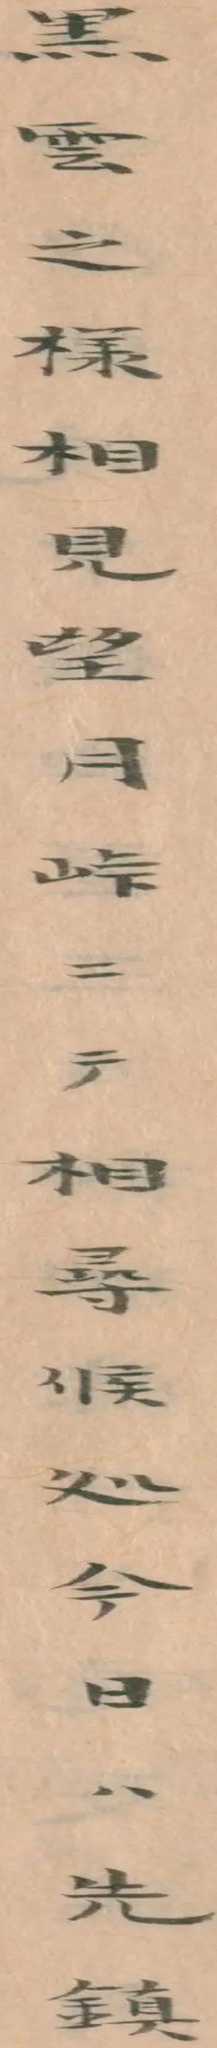黒雲之様相見望月峠ニテ相尋候処今日ハ先鎮
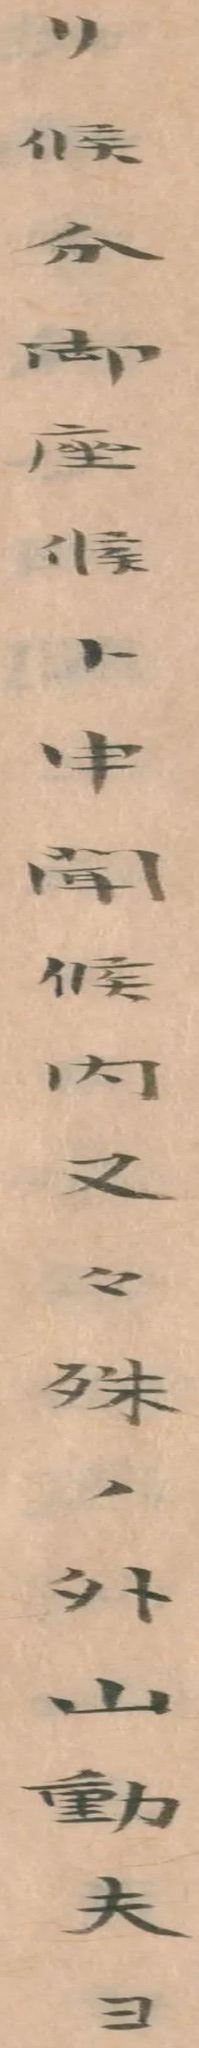リ候分御座候ト申聞候内又々殊ノ外山動夫ヨ
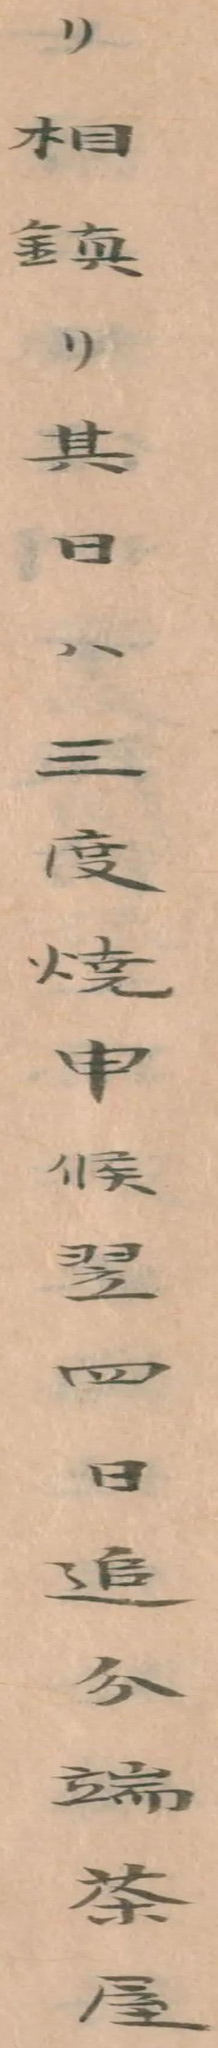リ相鎮り其日ハ三度焼申候翌四日追分端茶屋
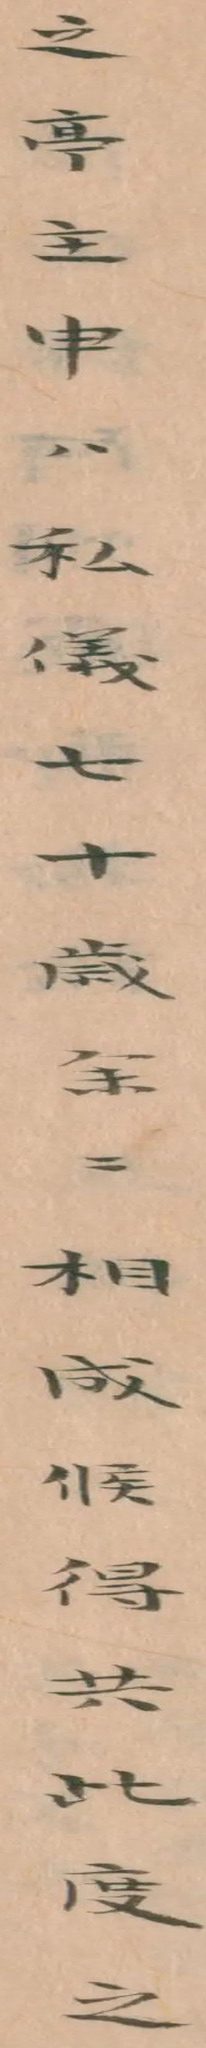之亭主申ニハ私儀七十才余ニ相成候得共此度
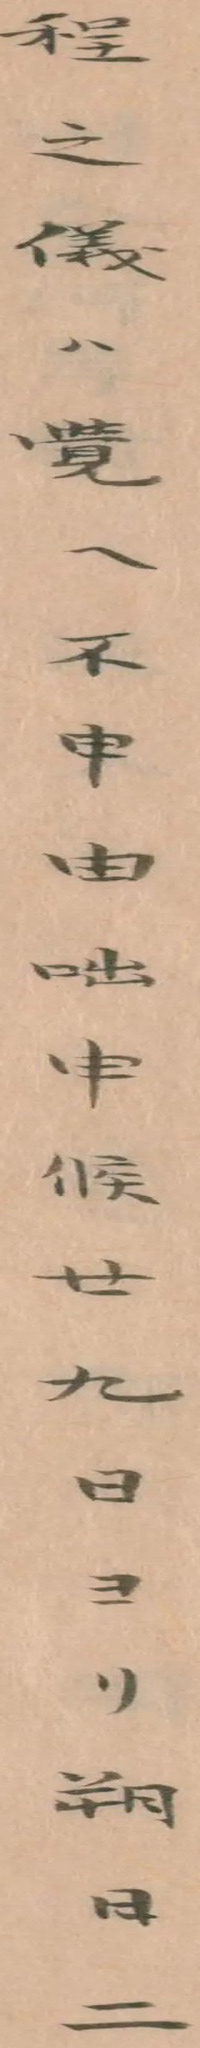程之儀ハ覚へ不申由咄申候廿九日ヨリ朔日二
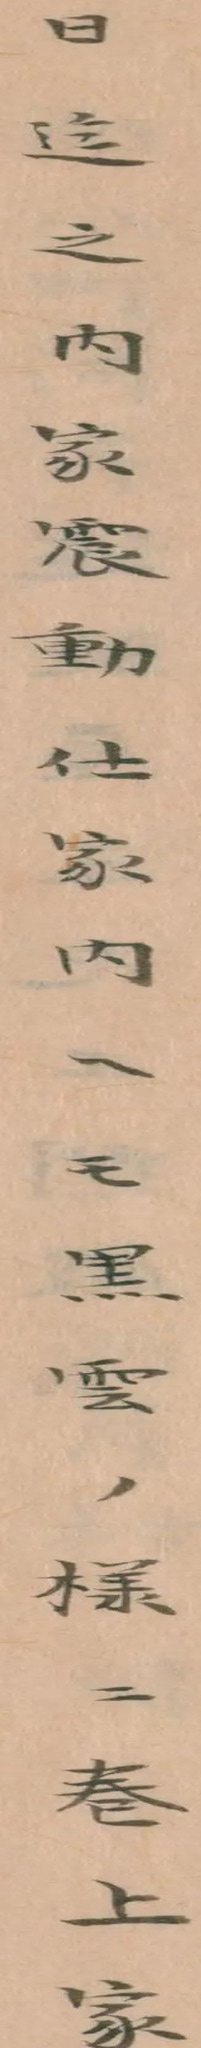日迄之内家震動仕家内へモ黒雲之様二巻上家
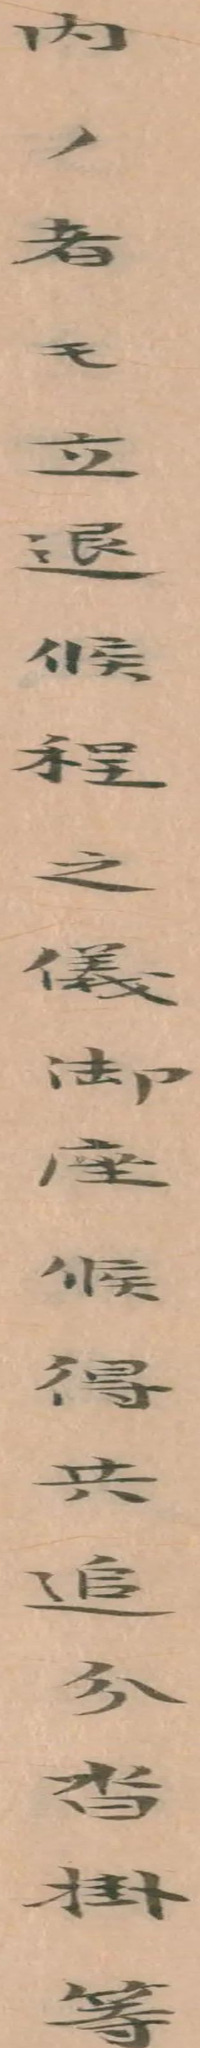内ノ者モ立退候程之儀御座候得共追分沓掛等
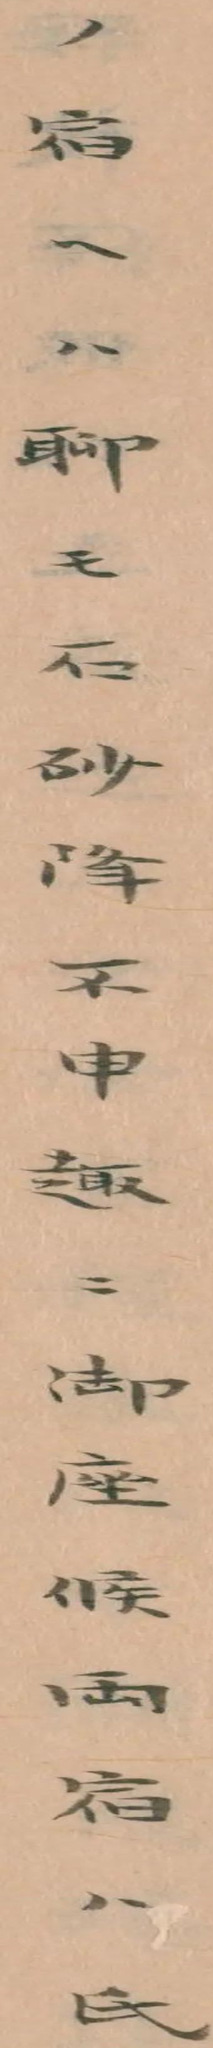ノ宿ヘハ聊モ石砂降不申趣二御座候両宿ハ氏
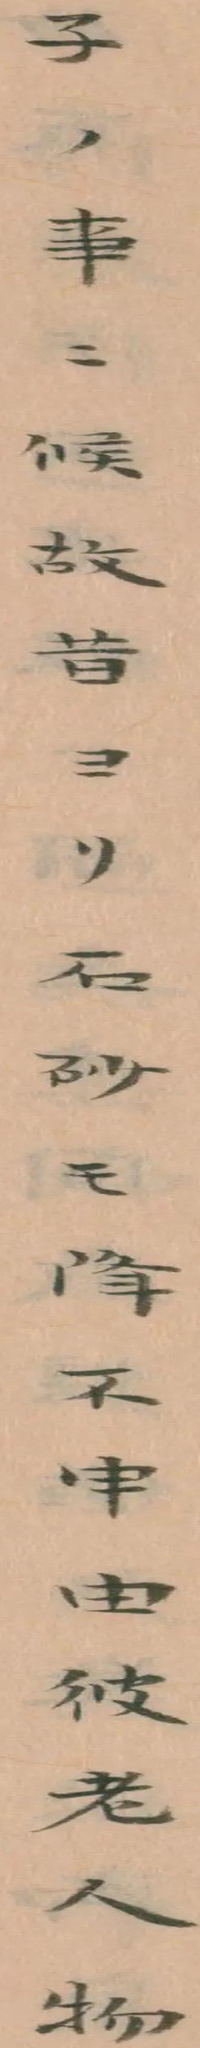子ノ事二候故昔ヨリ石砂モ降不申由彼老人物
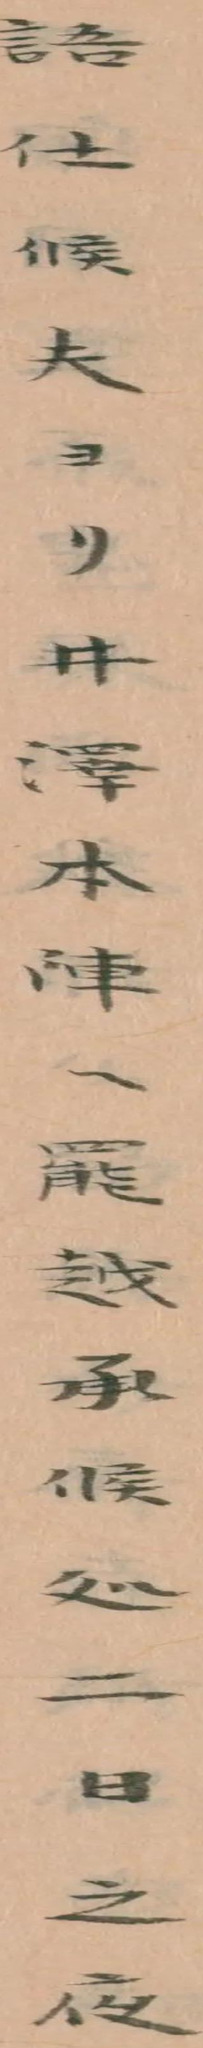語仕候夫ヨリ井沢本陣へ罷越承候処二日之夜
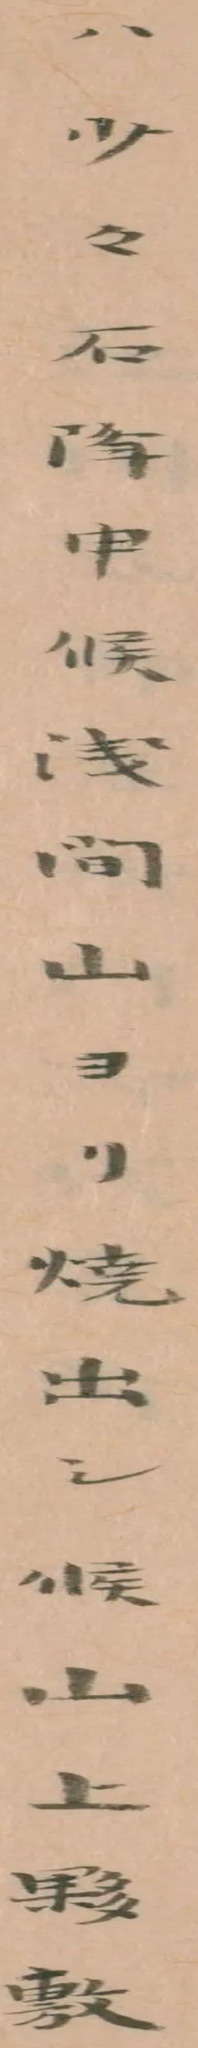ハ少々石降申候浅間山ヨリ焼出シ候山上夥敷
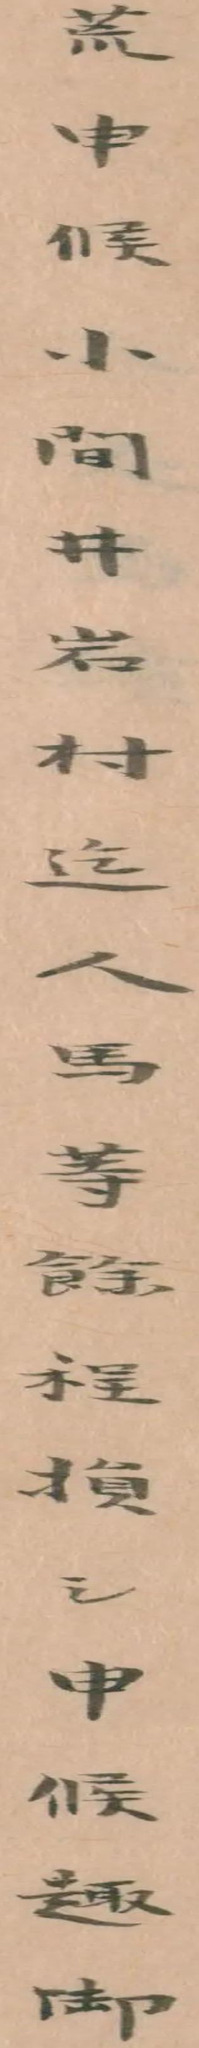荒振候小間井岩村迄人馬等余程損シ申候趣御
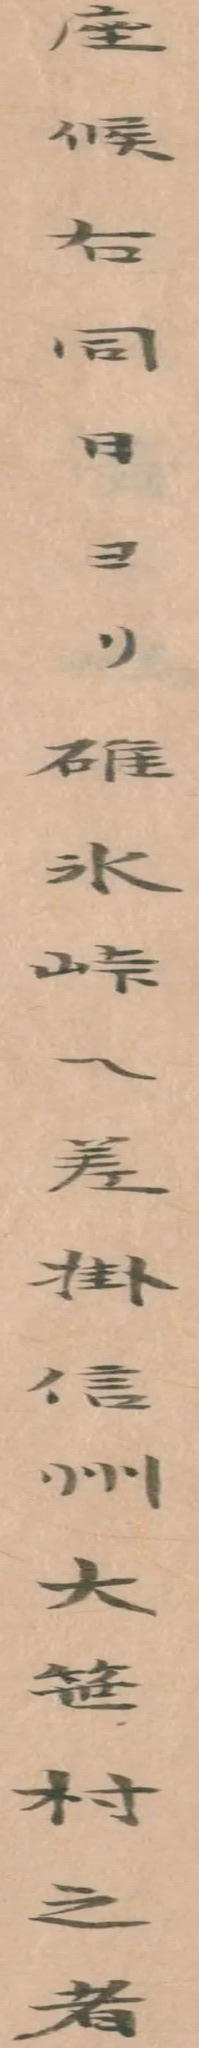座候右同日ヨリ碓氷峠へ差掛信州大笹村之者
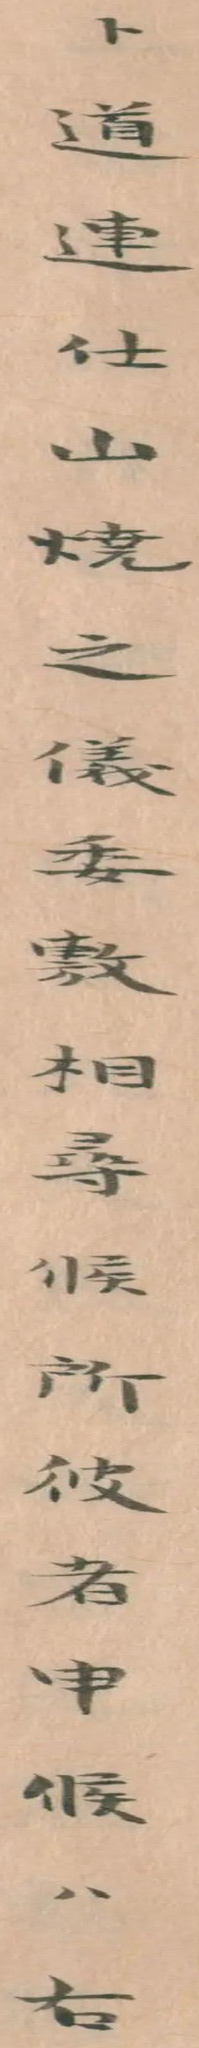ト道連仕山焼之儀委敷相尋候所彼者申候ハ右
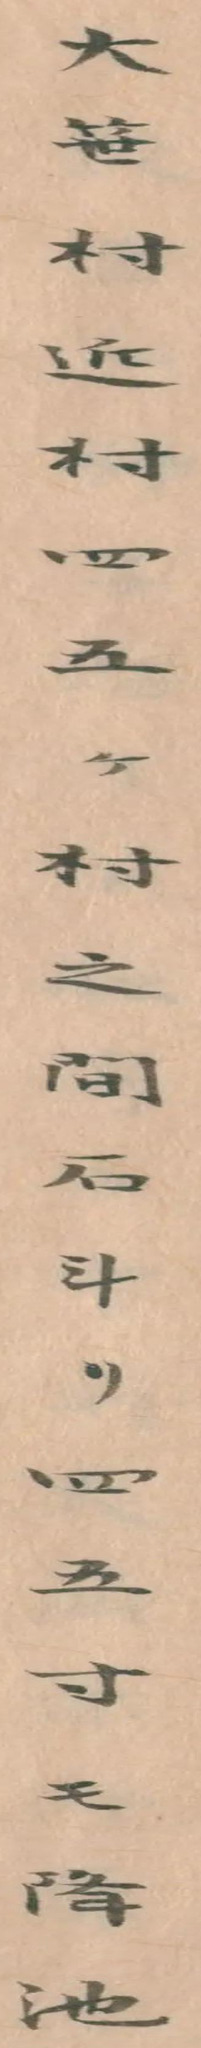大笹村近村四五ヶ村之間石斗り四五寸モ降池
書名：地災撮要. 巻1(噴火山・地震ノ部)
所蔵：国立国会図書館 National Diet Library, JAPAN
